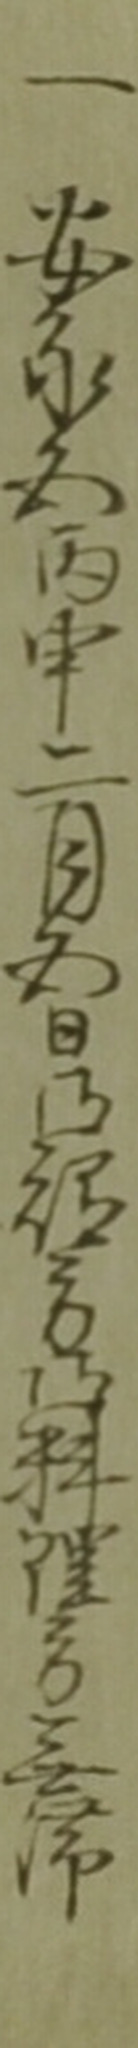一安永五丙申二月五日御賄方御料理方無滞
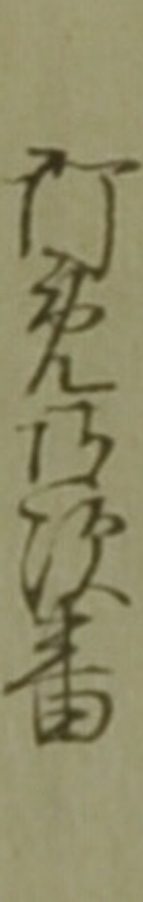御免御次番
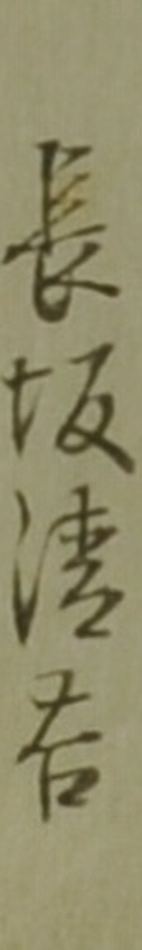長坂清吉

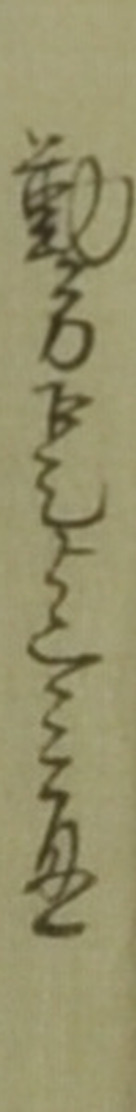勤方是迄之通
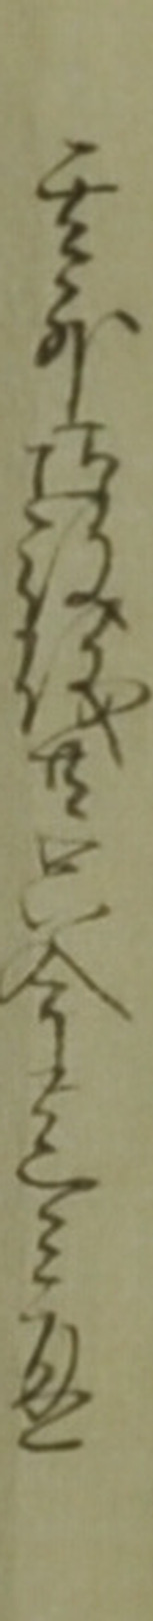其外御役儀共只今迄之通
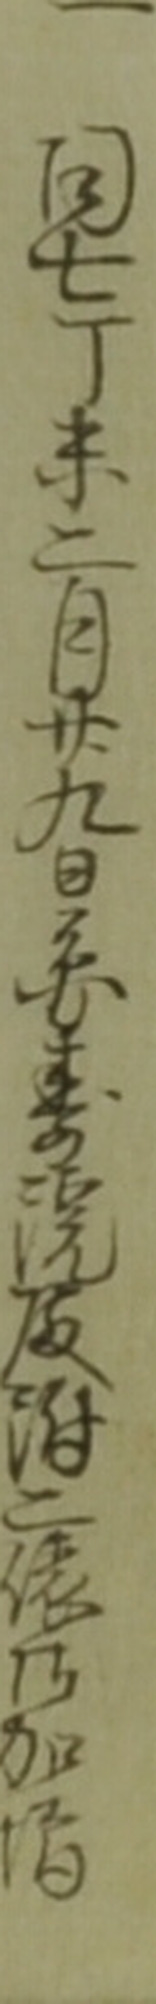一同七丁未二月廿九日圓寿院殿附二俵御加増
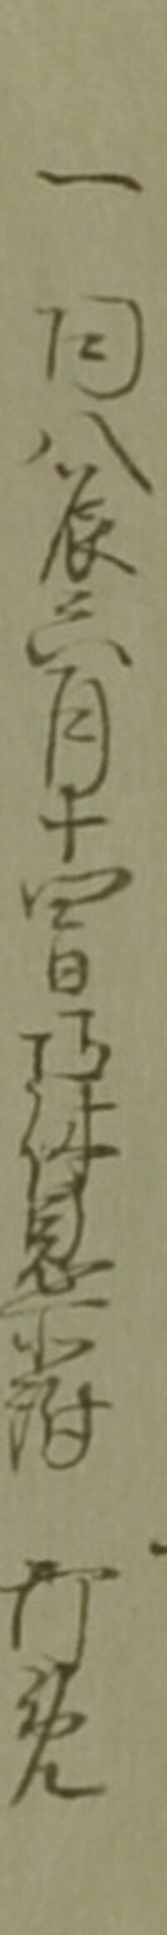一同八辰六月十四日御休息所附御免
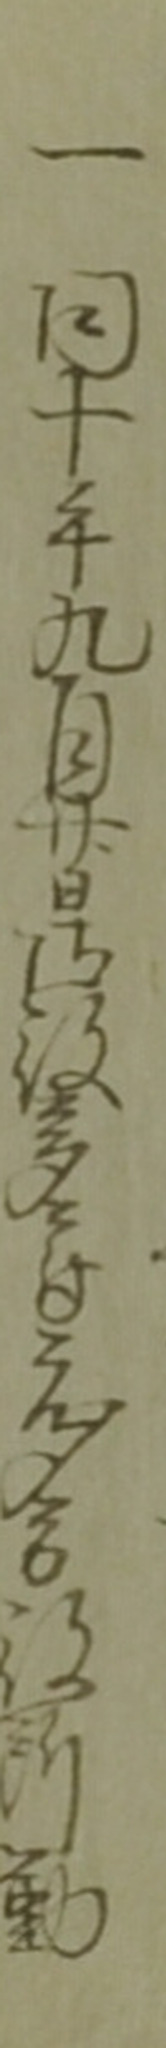一同十午九月廿日御役多ニ付元〆方役所勤
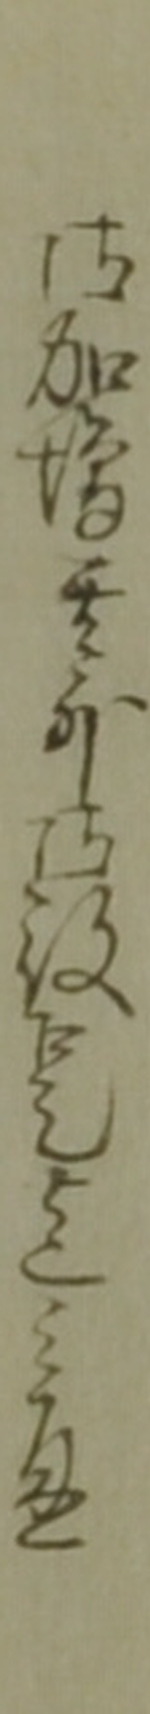御加増其外御役是迄之通
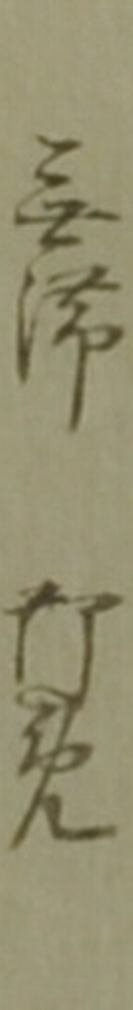無滞御免
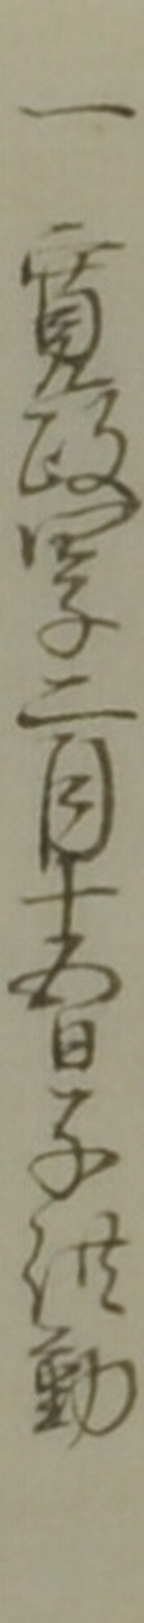一寛政四子二月十五日子供勤
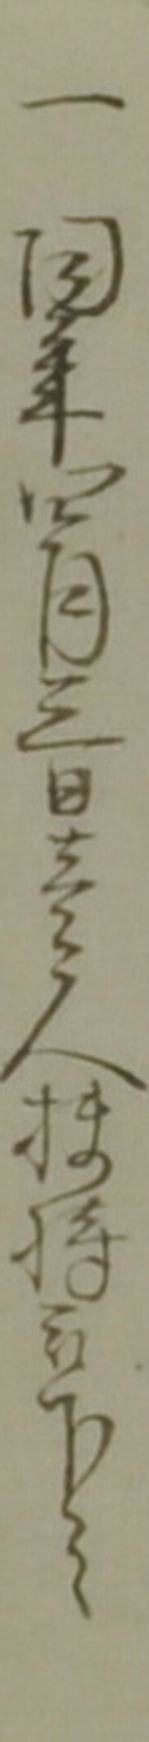一同年四月三日壱人扶持被下之

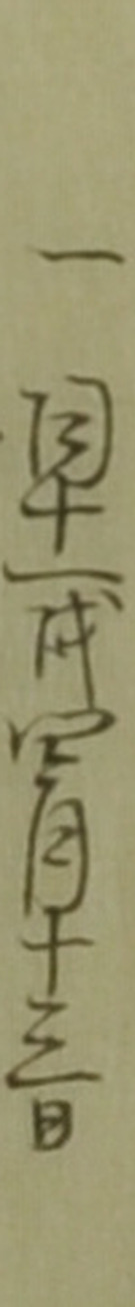一同十一戌四月十三日

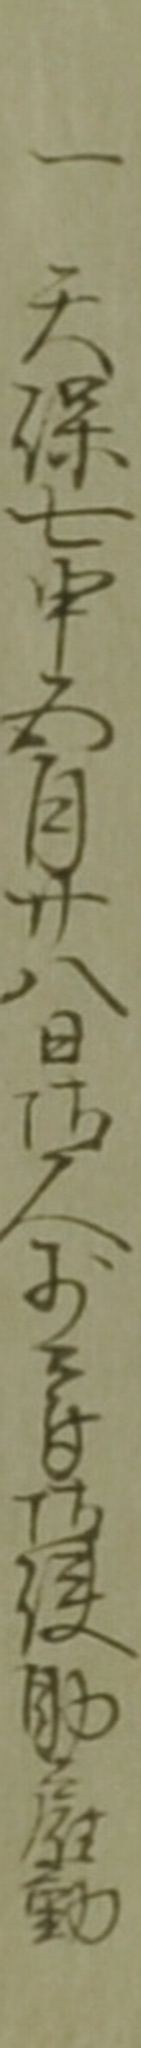一天保七申五月廿八日御人少ニ付御使助雇勤
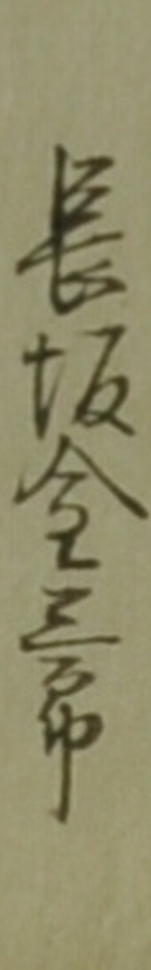長坂金三郎
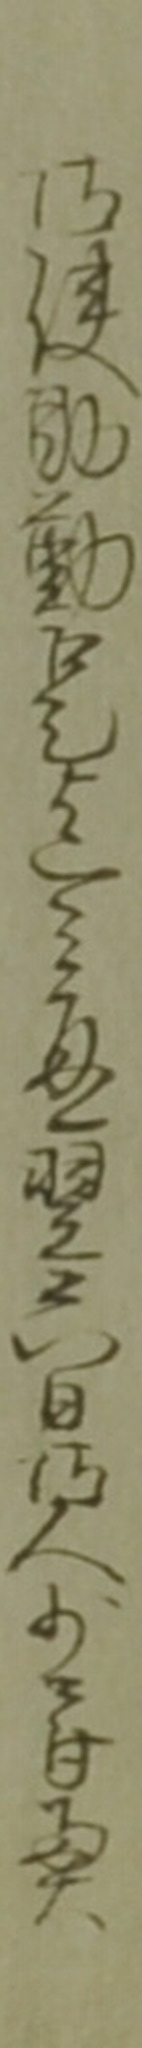御使助勤是迄之通翌六被御人少ニ付奥
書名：無足諸士勤仕録（二）
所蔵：伊那市立高遠町図書館・合同会社AMANE
